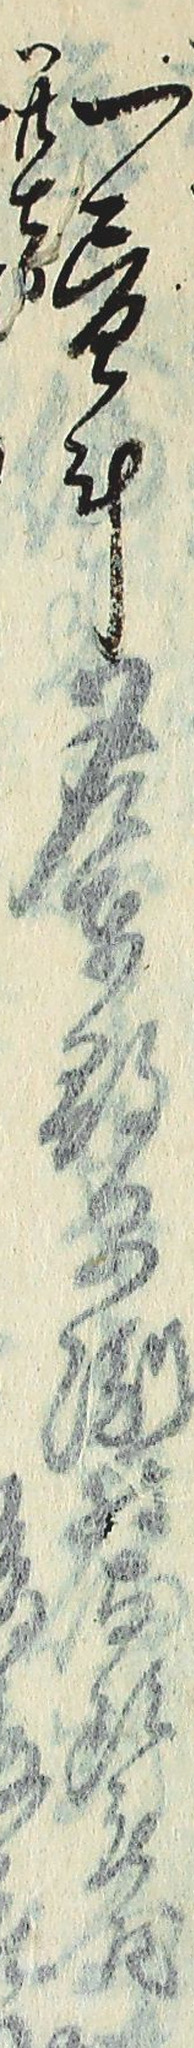一昼夜
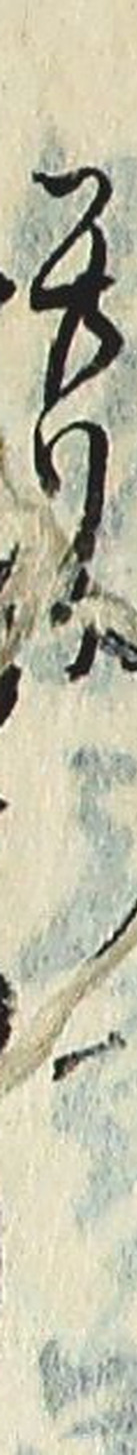同廿一日
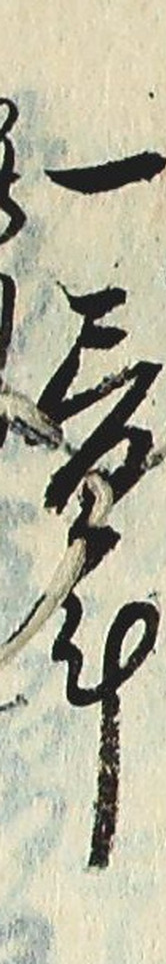一昼夜
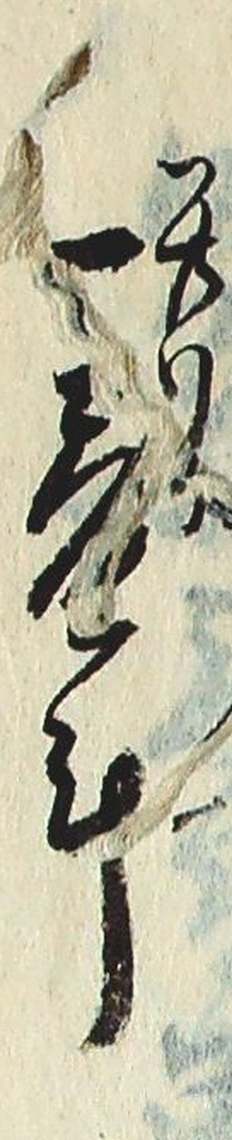一昼夜
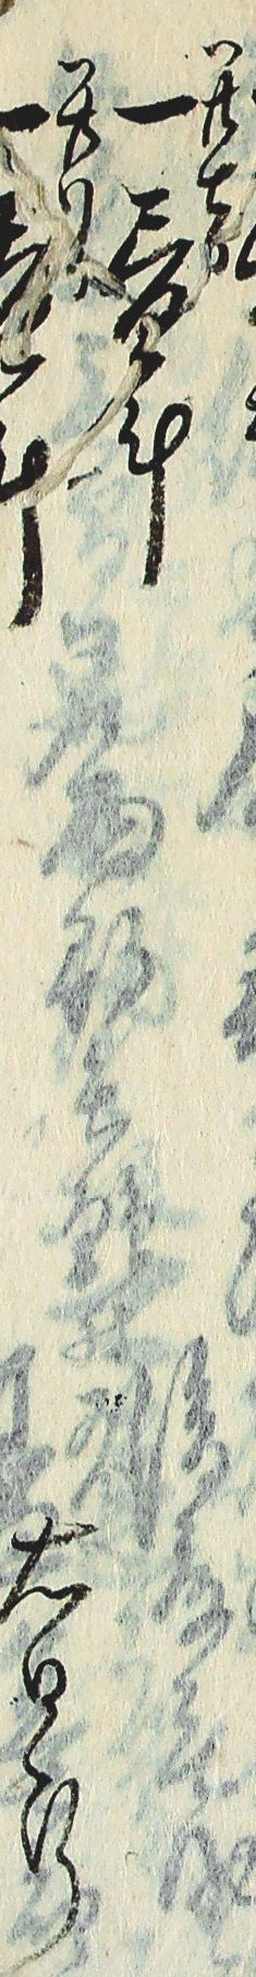一昼夜右同断
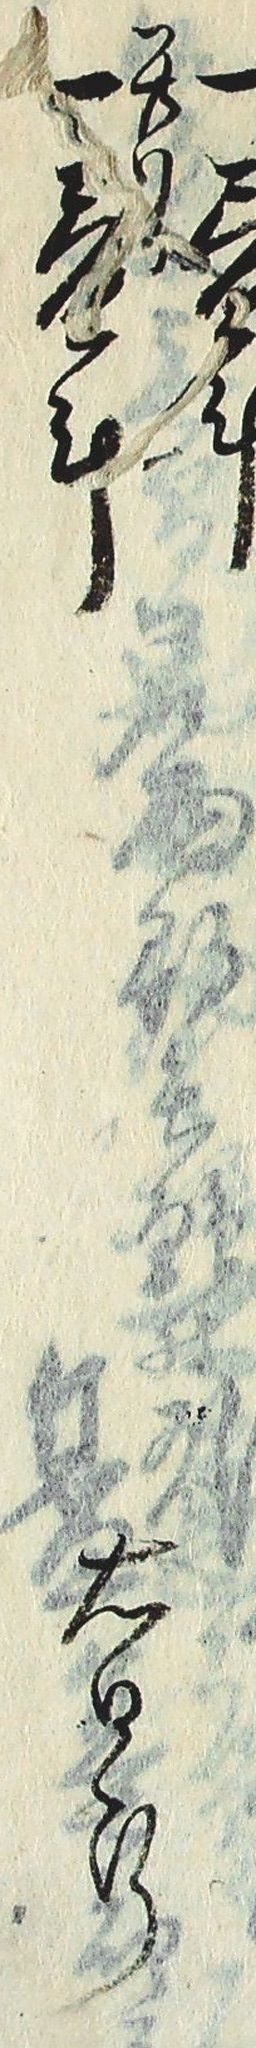一昼夜右同断
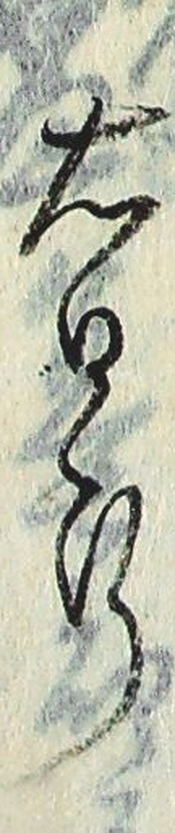一昼夜右同断

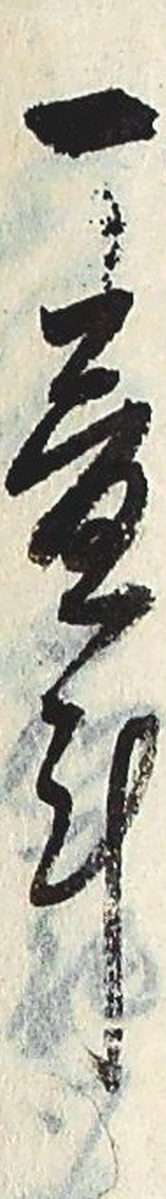一昼計
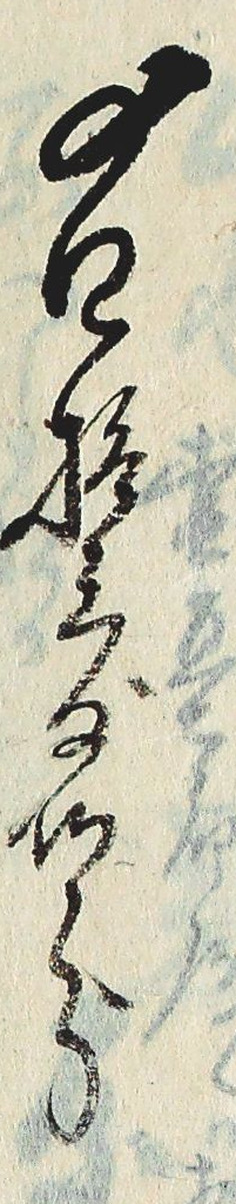〆四拾三匁弐分
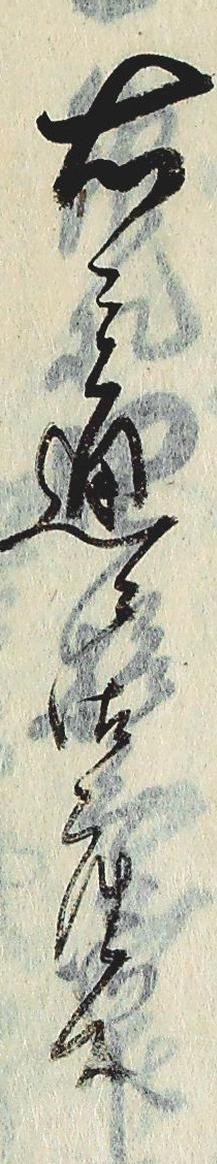右之通に御座候
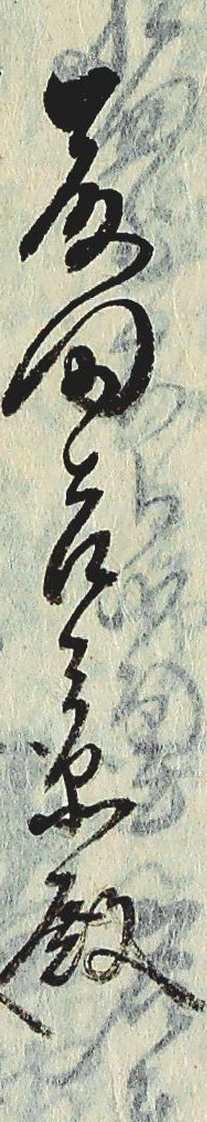藤田吉兵衛殿
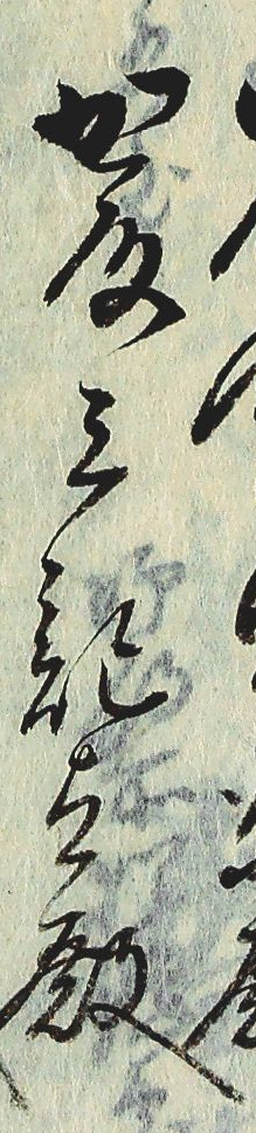加藤三紀太殿
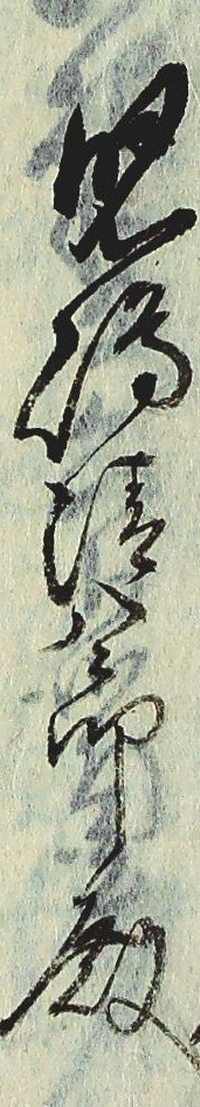児島清八郎殿
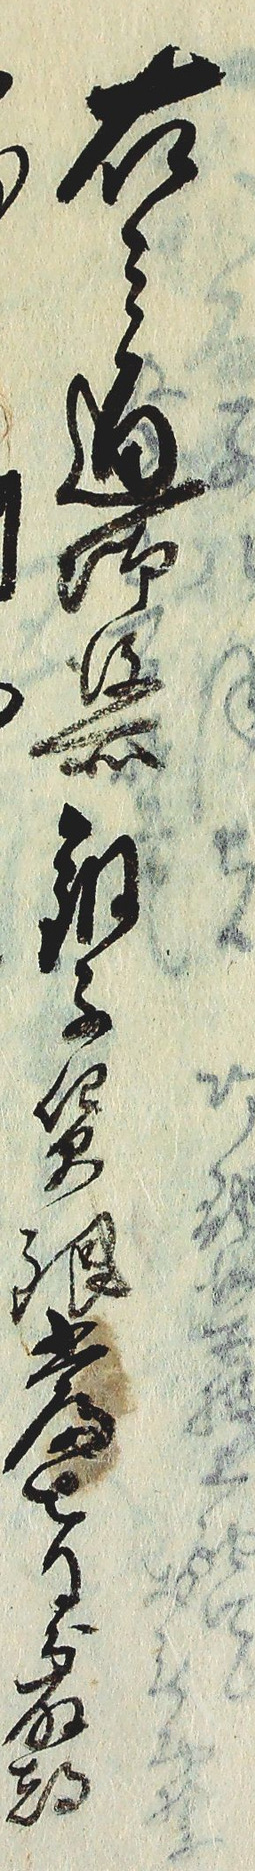右之通御役所銅子賃金当七月ゟ取都
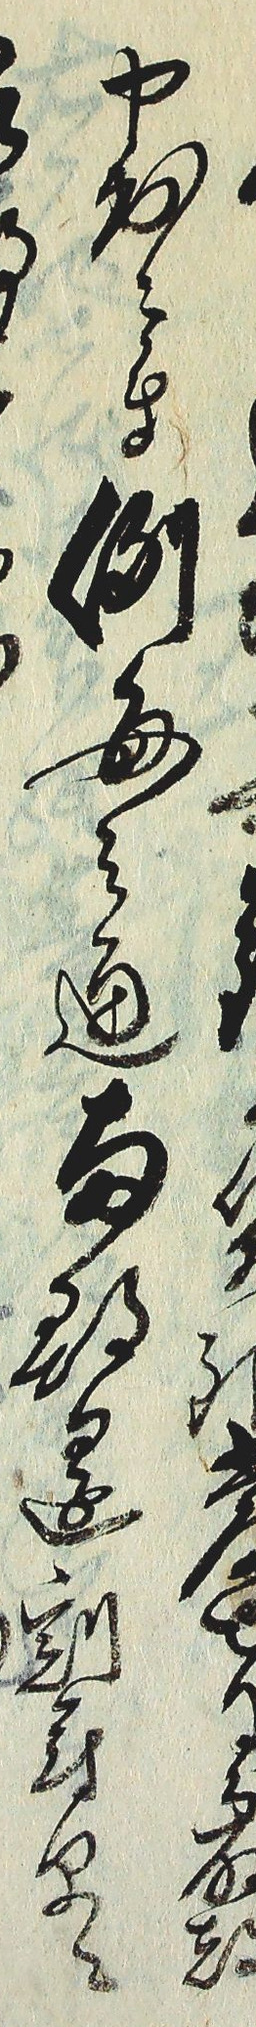申出に付例毎之通両郡割符早々
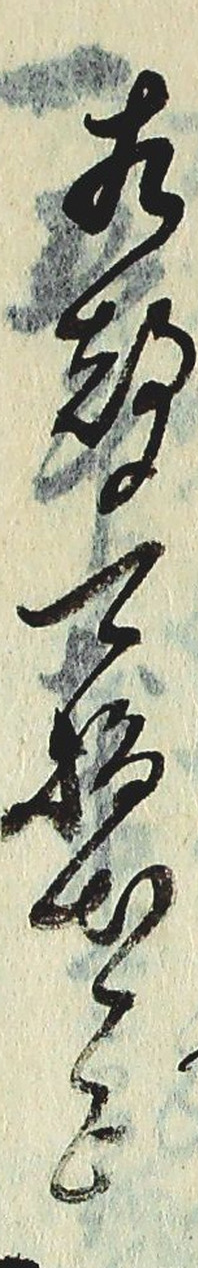相都め可指出候以上
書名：名東郡中諸割賦元帳
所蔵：鳴門教育大学 Naruto University of Education
